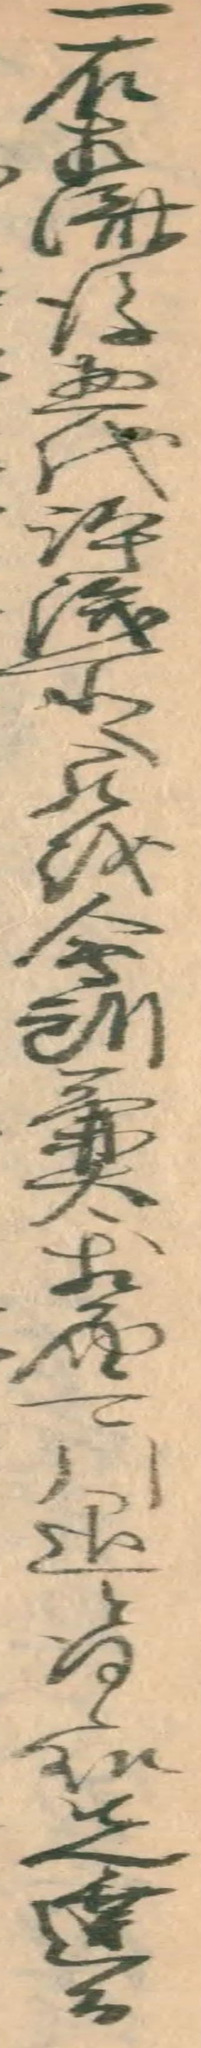一右相済後惣代評議所へ罷越会所兼太へ相届可引退と存候処先達而
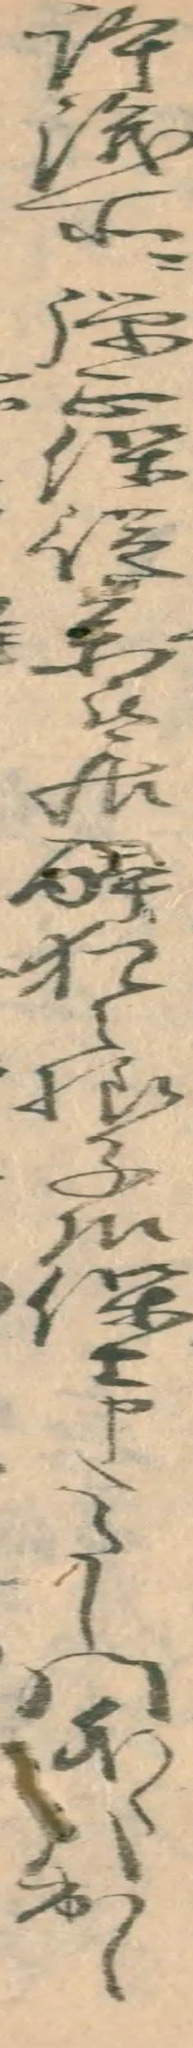評議所ニ弾正保従参被居酔狂之様子故保土申たゝし門外へ引出し
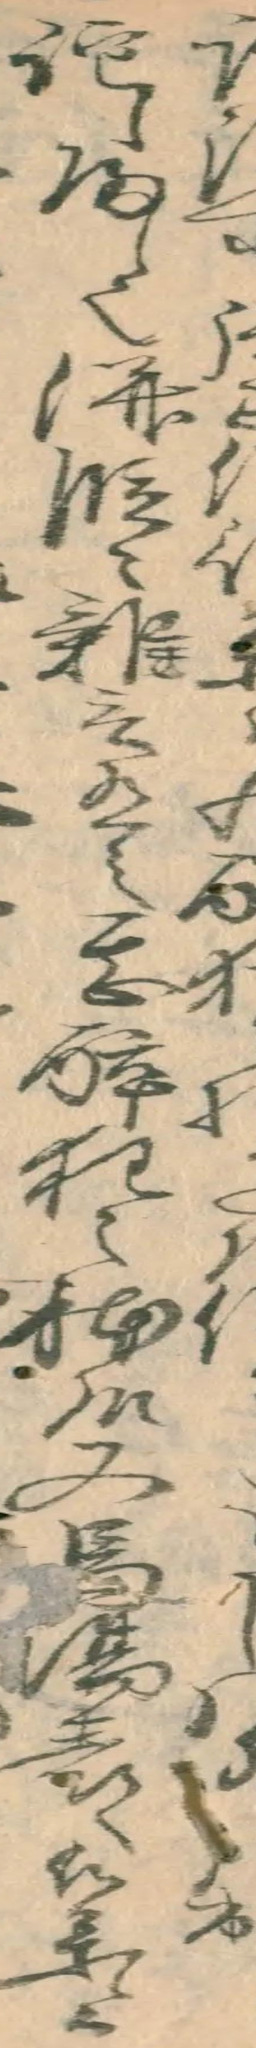詫し帰候也併段々雑言有之甚酔狂之体故又馬場表へ被参候而
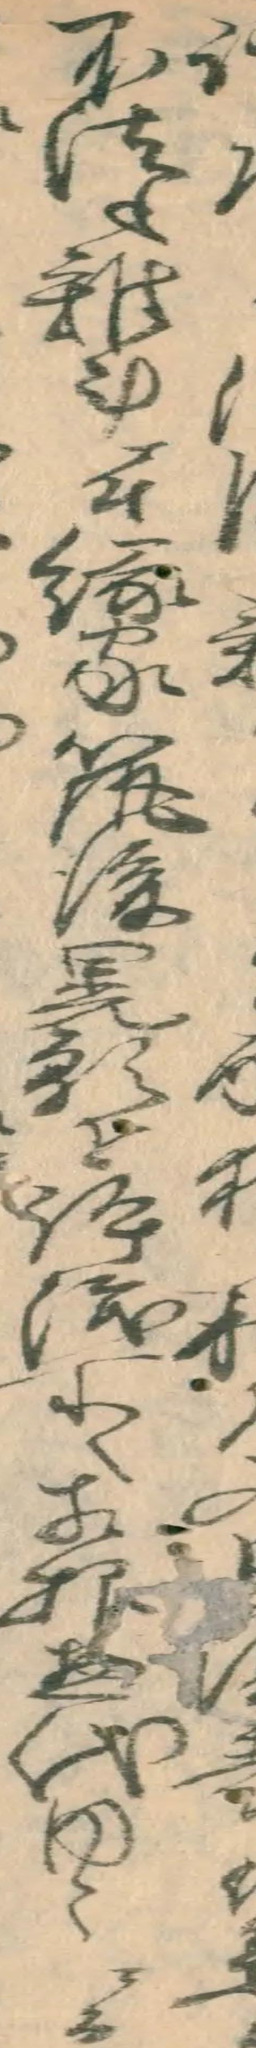不法も難計ニ付縁家筑後晃顕を評議所へ相招惣代内々ニ而
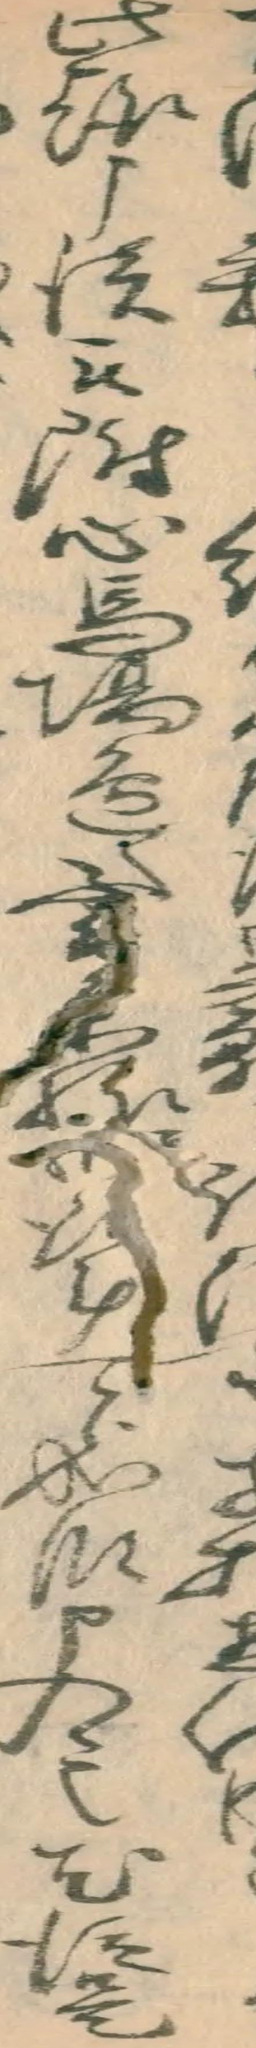此趣申談被付心馬場辺へ不被参様ニ被取計可被成段申入候也尤従是
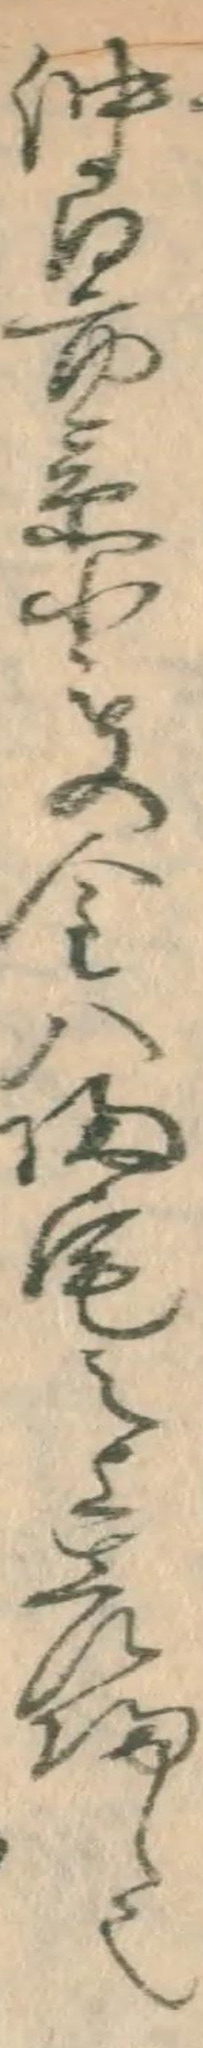仲間市兵衛小もの金八帰宅之上差帰候也
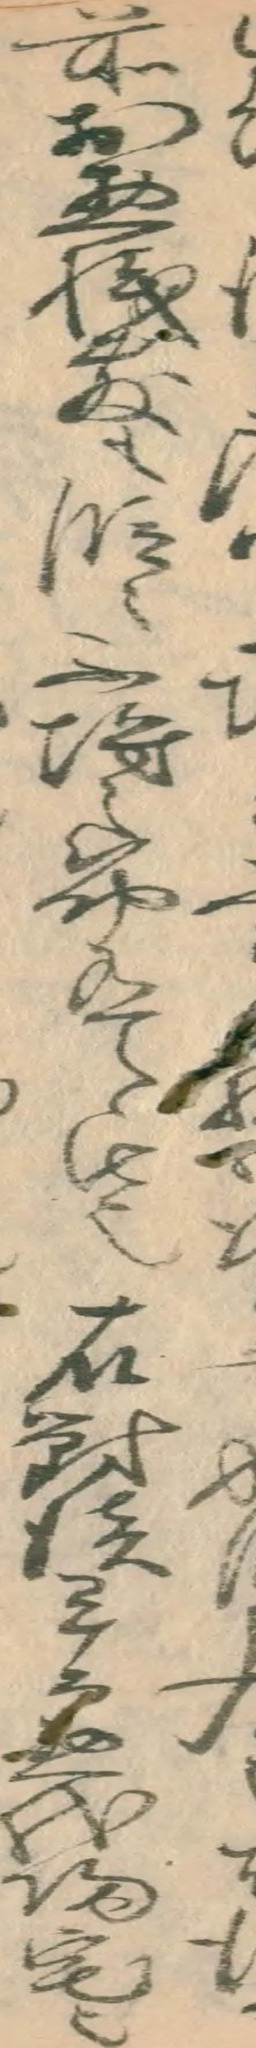前於惣桟敷も段々不埒之筋有之候由也右対談畢而惣代帰宅也
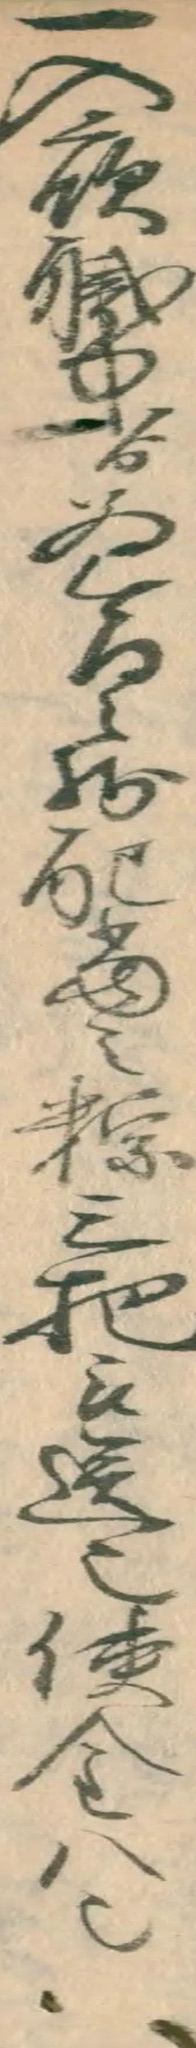一入夜職中ゟ為今日之残配当之粽三把被送也使金八也
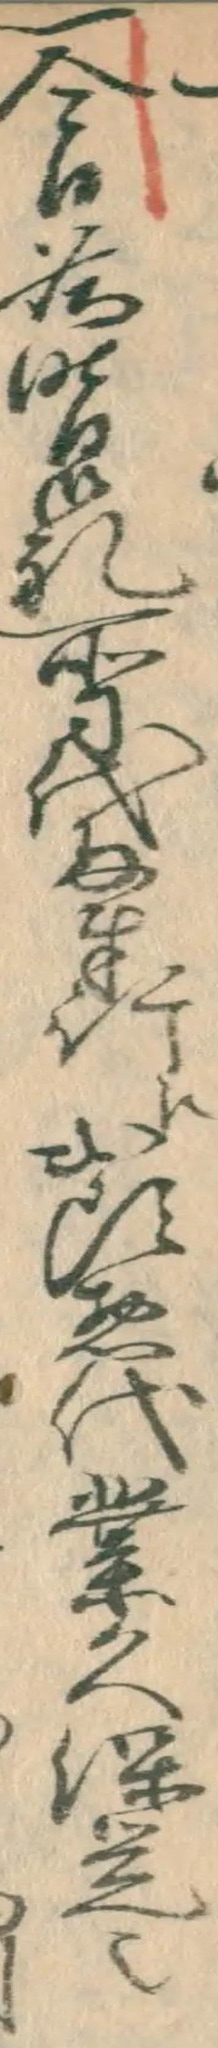一今日為昨日御礼所司代両奉行江出頭惣代業久保覚也
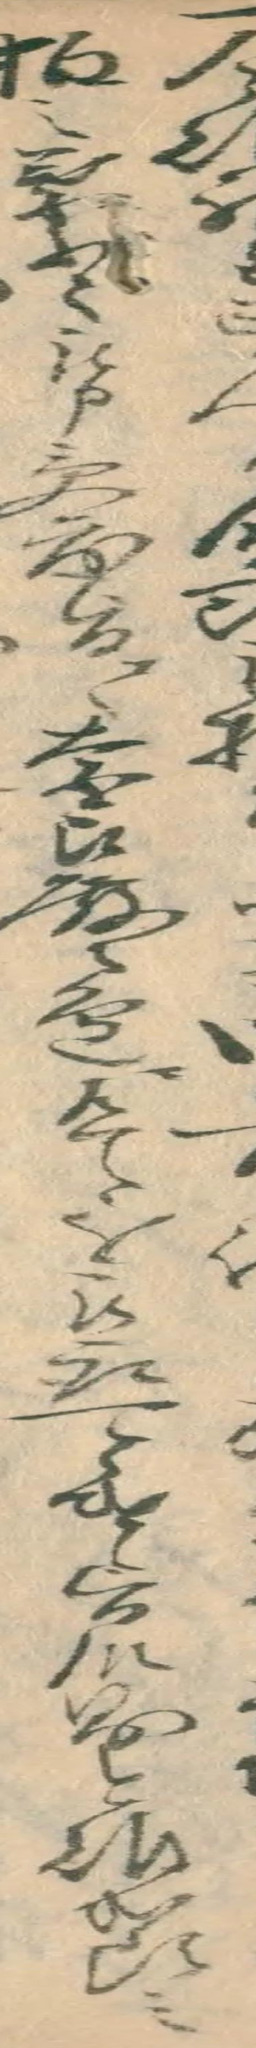柏之葉少々被申受度旨ニ候奈良殿之辺ニ有之候を被取可被遣候旨故則今朝出頭之
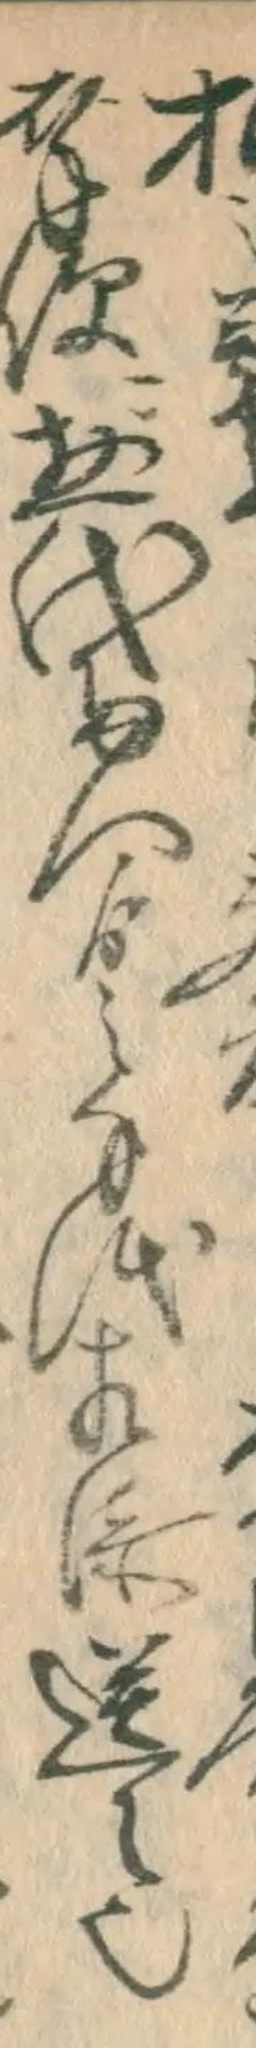幸便ニ惣代両人ゟ之手紙相添送之也
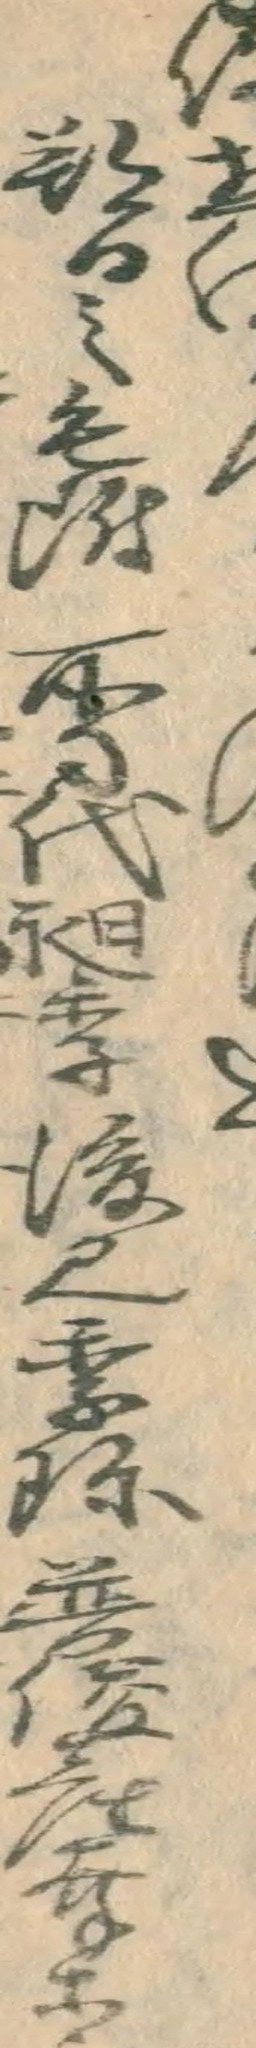朔日之毛付所司代昶季後見季珎普俊産幸等也

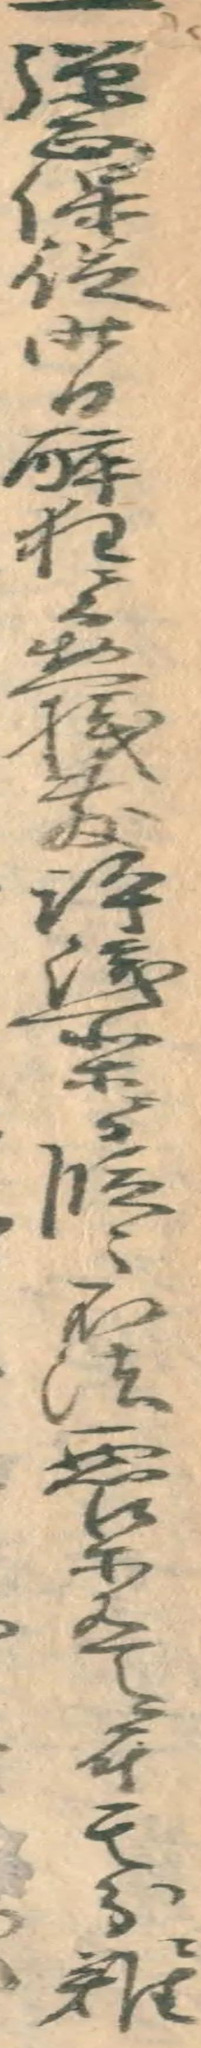一弾正保従昨日酔狂ニ而惣桟敷評議所等ニ而段々不法悪口等有之ニ付其分ニ難
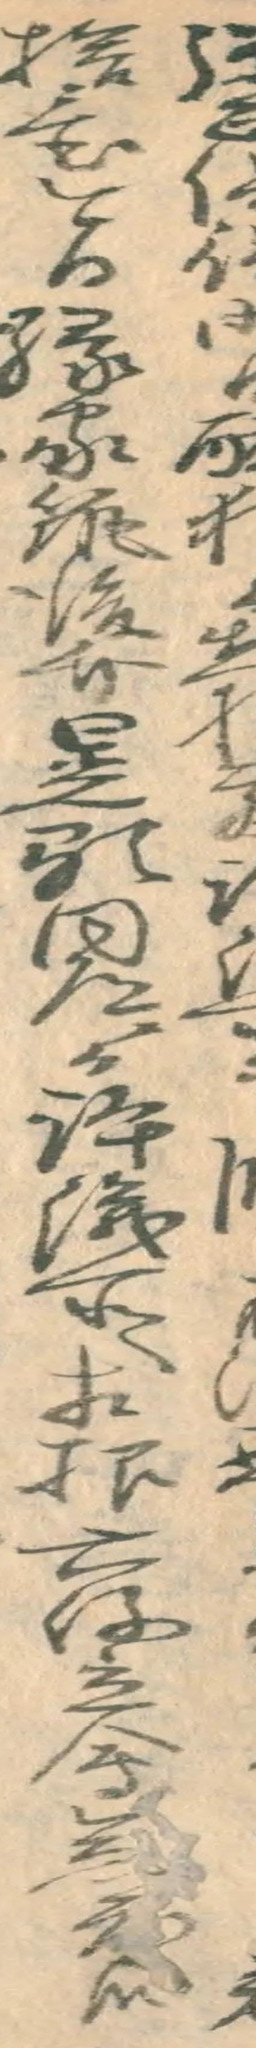捨置今日縁家筑後介晃顕同道ニ而評議所へ相招六役立会急度御
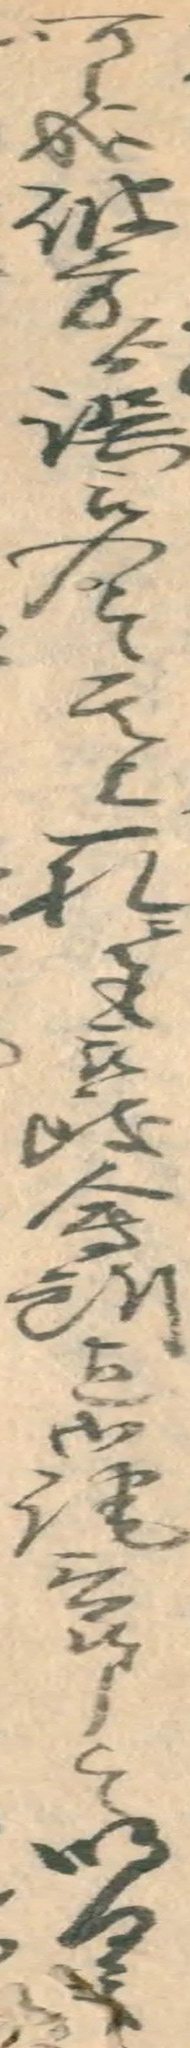呵被成彼方ゟ誤被入候ハヽ其上一札ニても被致会所迄御詫言被申候て明日ニも
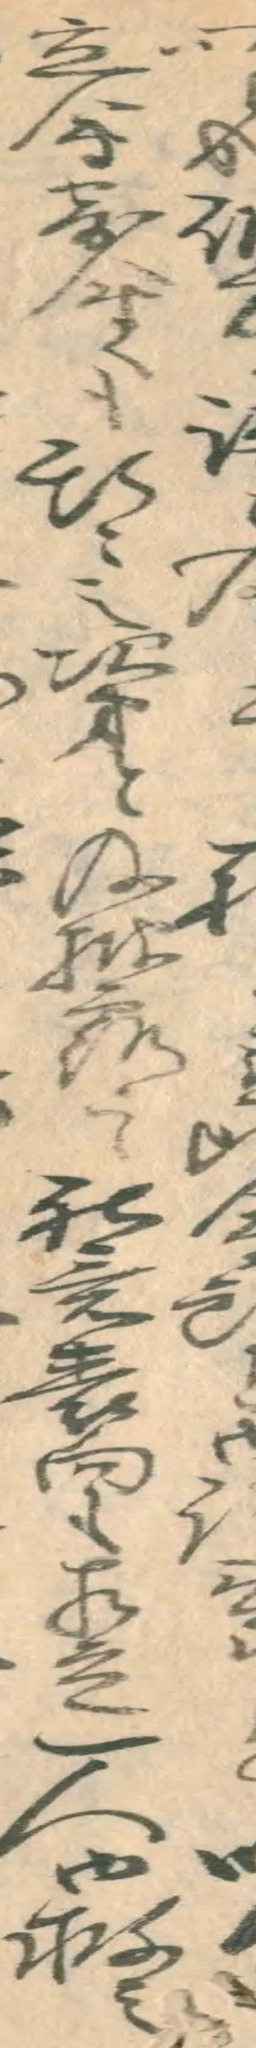立会寄会へも斯々之次第と及披露候ハヽ社意表向も相立一人御救之
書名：賀茂社記録. 第58冊
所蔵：国立国会図書館 National Diet Library, JAPAN
